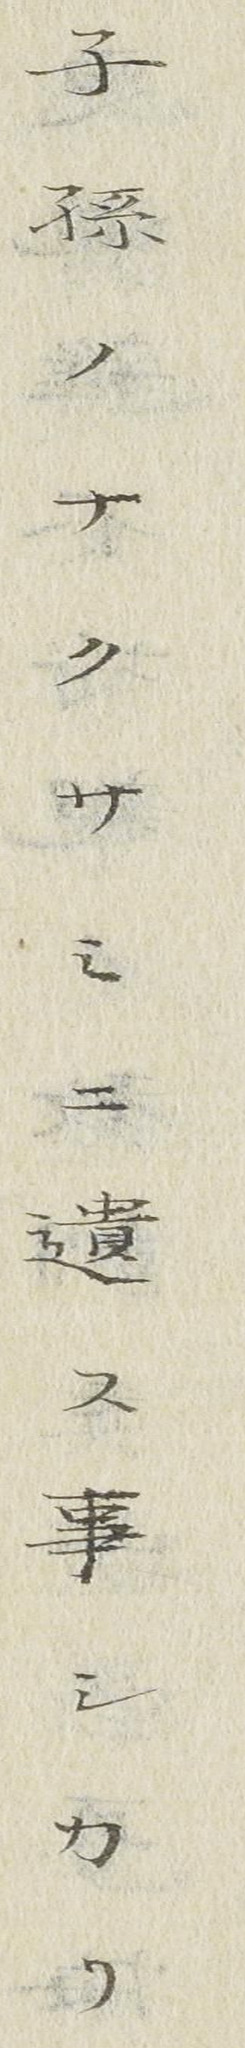子孫ノナクサミニ遺ス事シカリ
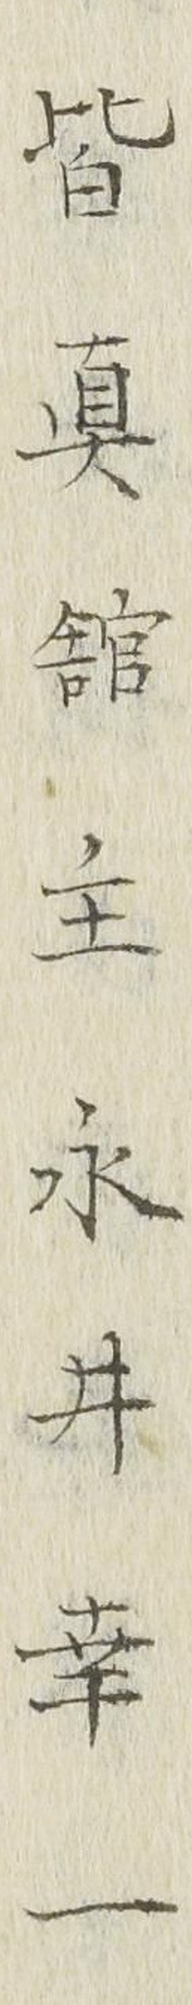皆真館主永井幸一
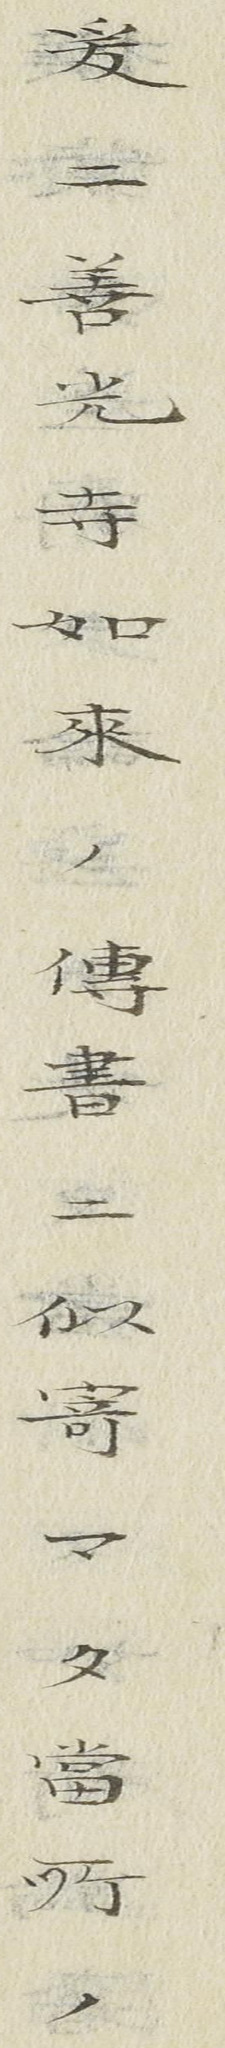爰ニ善光寺如来ノ伝書ニ似寄マタ当所ノ
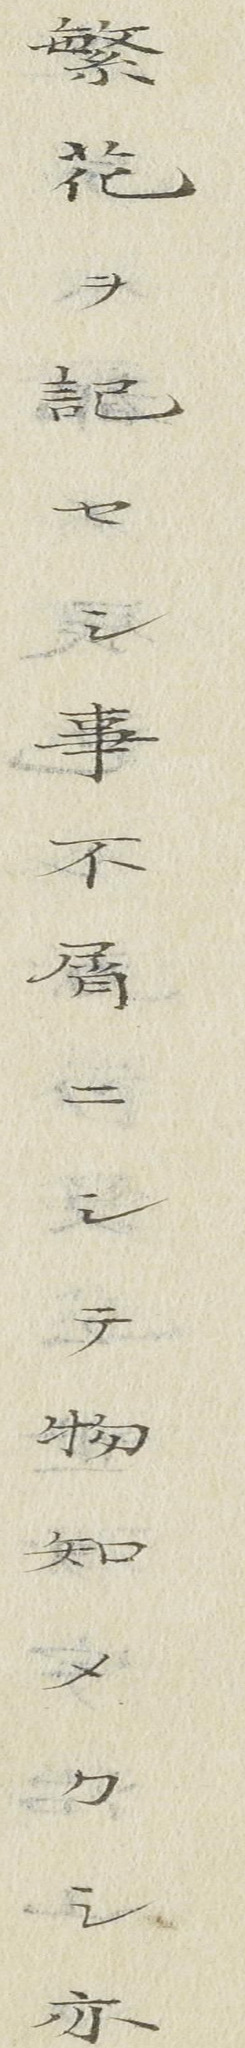繁花ヲ記セシ事不屑ニシテ物知メカシ亦
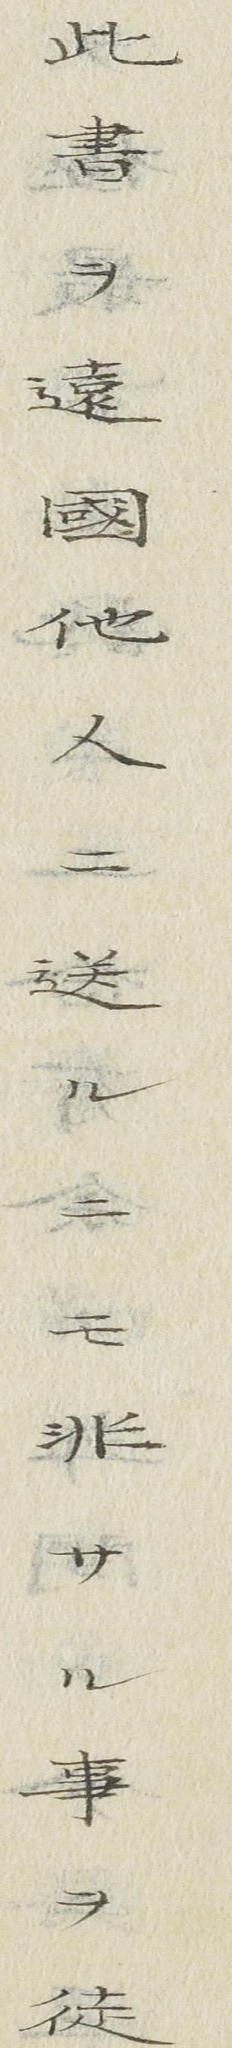此書ヲ遠国他人ニ送ルニモ非サル事ヲ徒
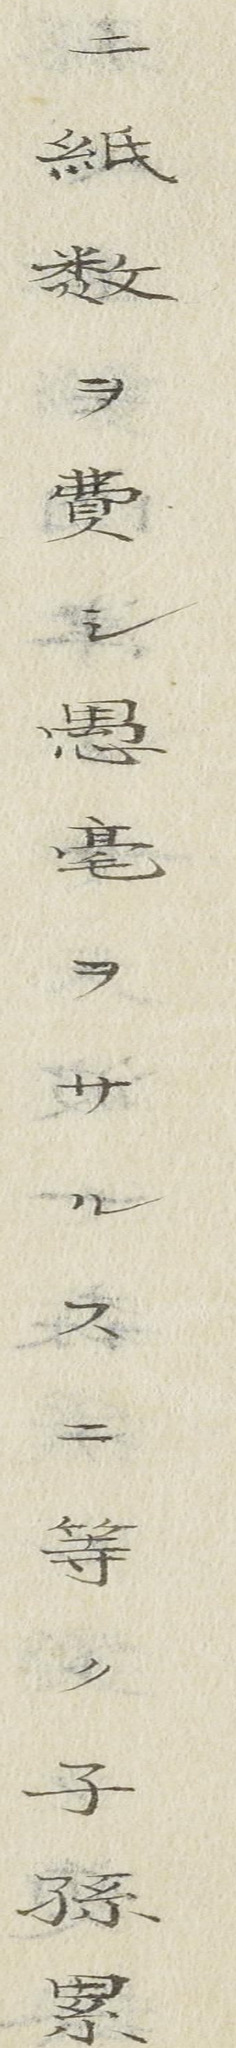ニ紙数ヲ費シ愚毫ヲサルスニ等ク子孫累
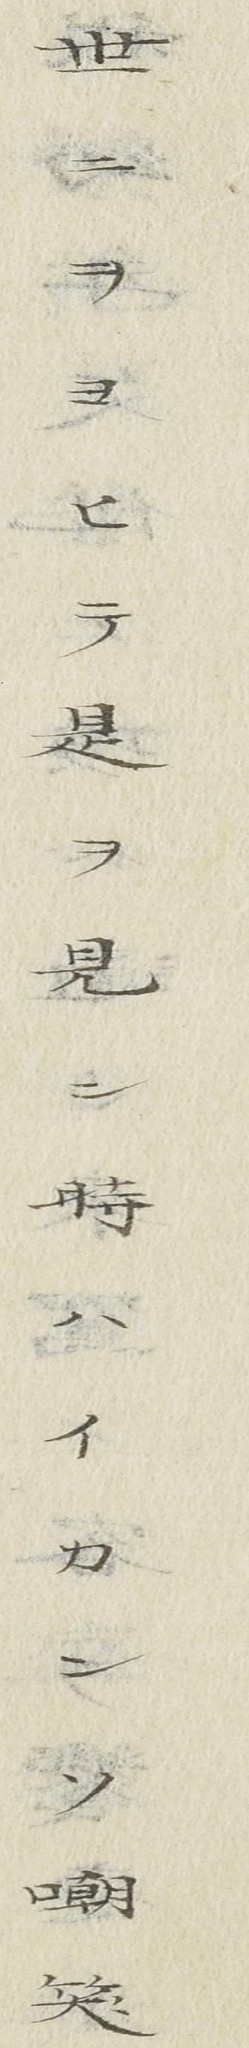世ニヲヨヒテ是ヲ見ン時ハイカンソ嘲笑
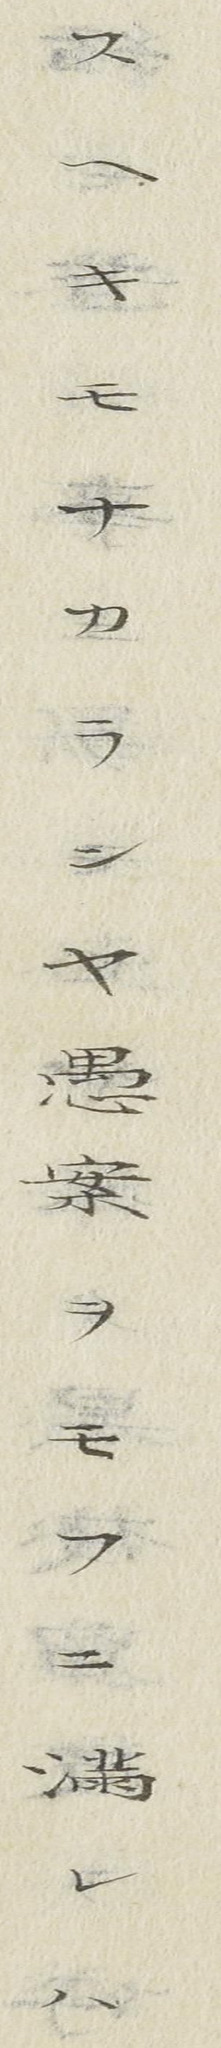スヘキモナカランヤ愚案ヲモフニ満レハ
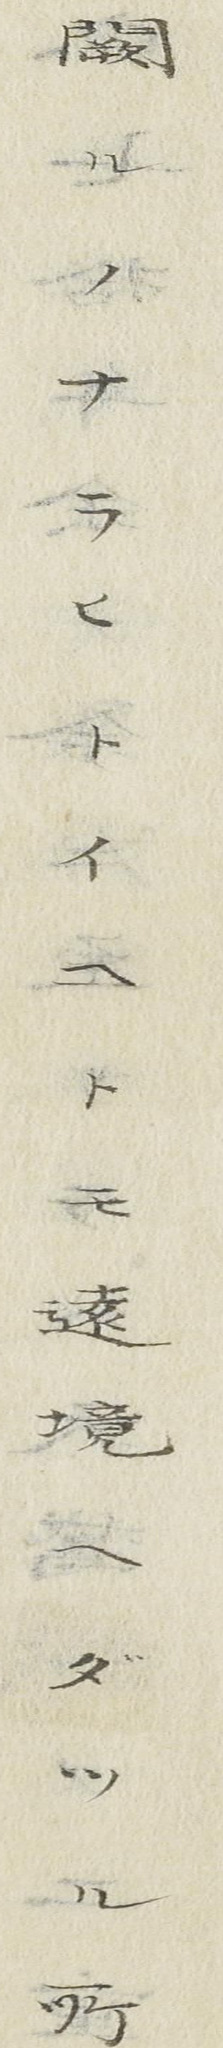闕ルノナラヒトイヘトモ遠境ヘダツル所
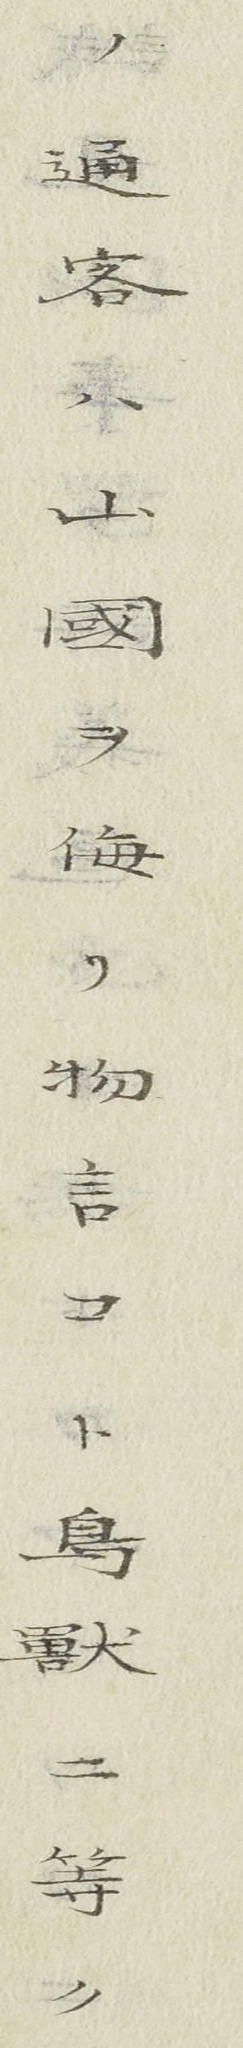ノ通客ハ山国ヲ侮リ物言コト鳥獣ニ等ク
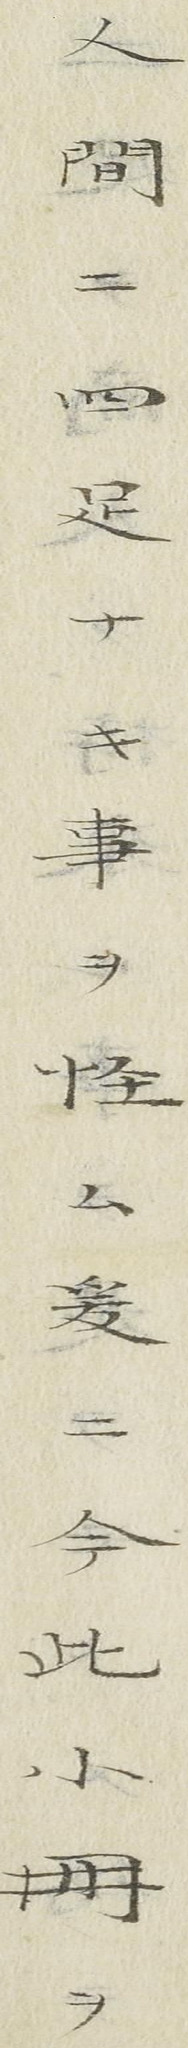人間ニ四足ナキ事ヲ怪ム爰ニ今此小冊ヲ
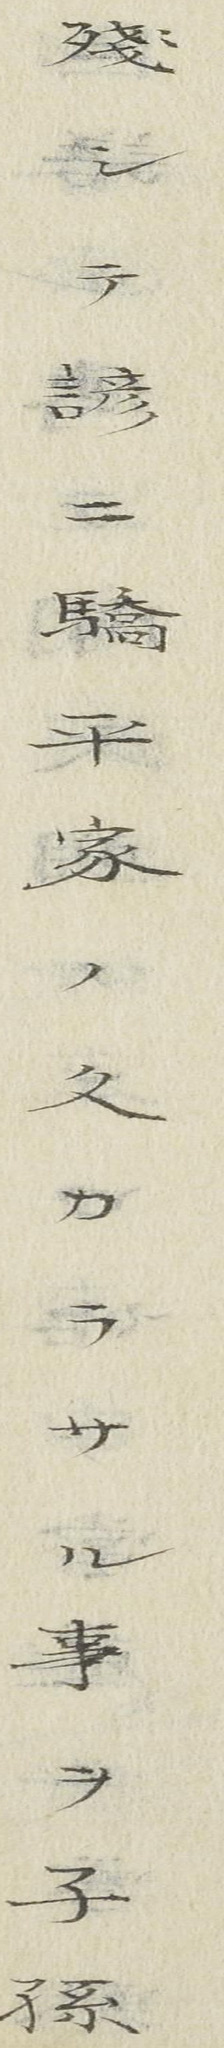残シテ諺ニ驕平家ノ久カラサル事ヲ子孫

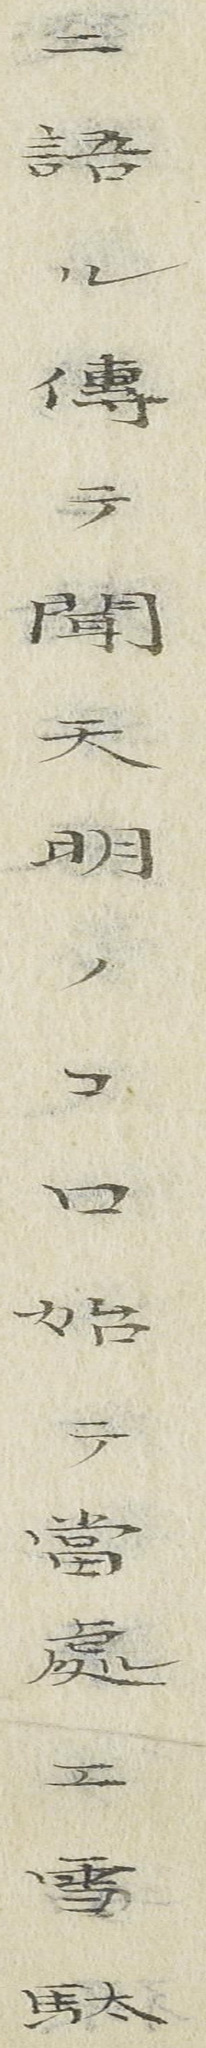ニ語ル伝テ聞天明ノコロ始テ当処エ雪駄
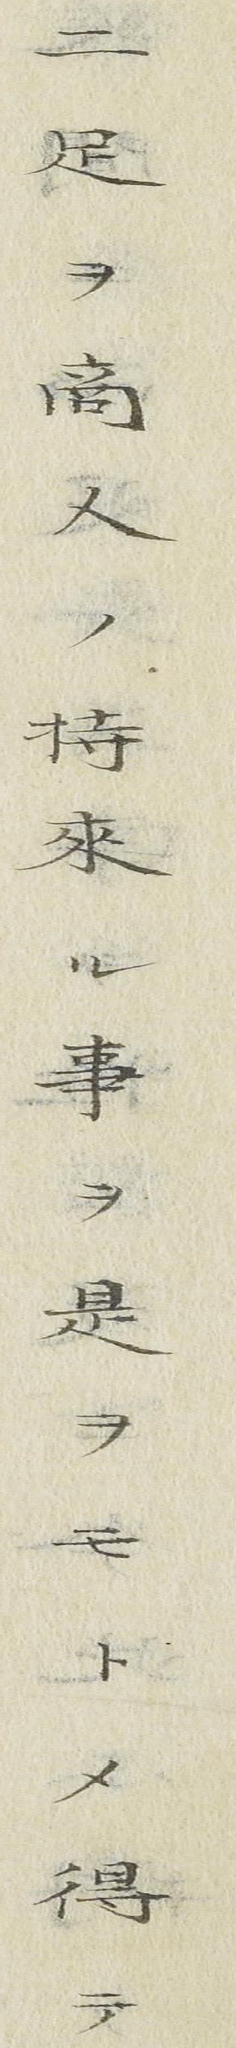ニ足ヲ商人ノ持来ル事ヲ是ヲモトメ得テ
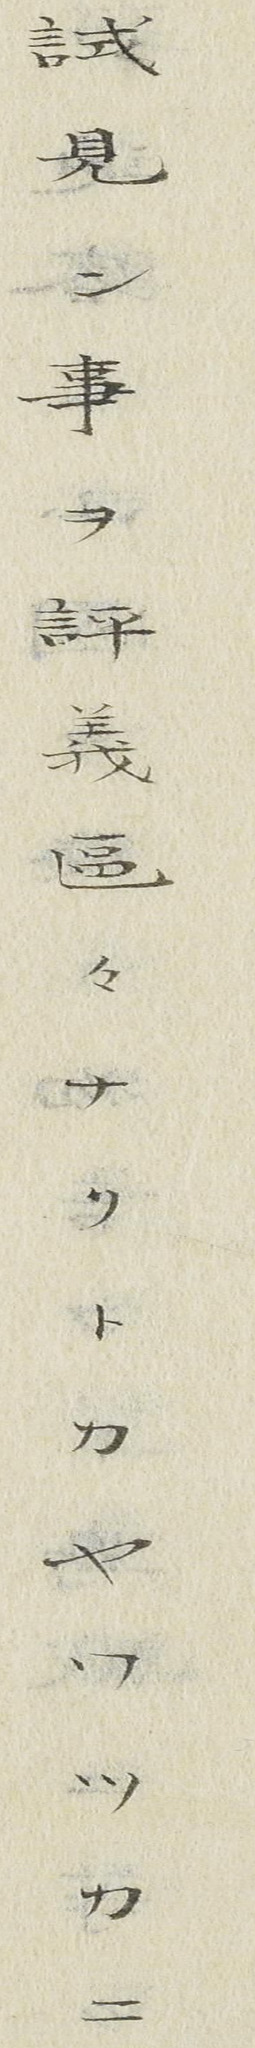試見ン事ヲ評義区々ナリトカヤワツカニ
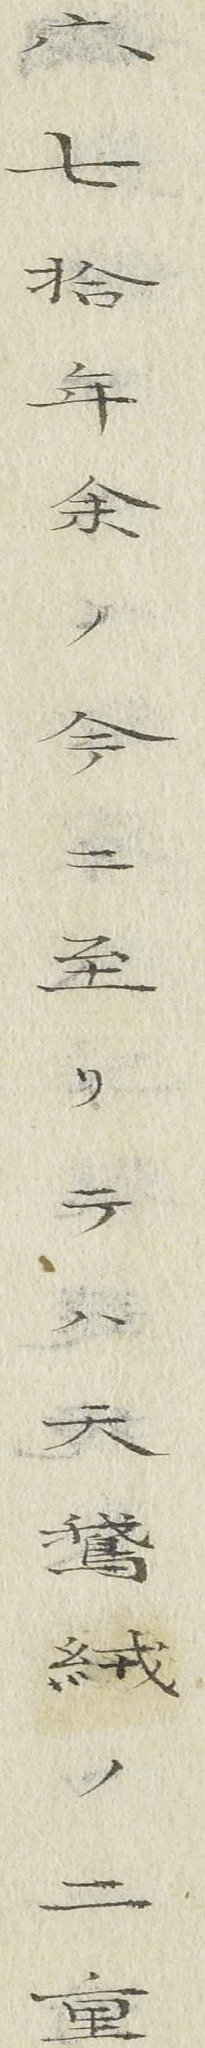六七拾年余ノ今ニ至リテハ天鵞紙ノ二重
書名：地災撮要　地震之部　巻ノ二
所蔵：東京大学地震研究所図書室 Earthquake Research Institute Library, The University of Tokyo, JAPAN
